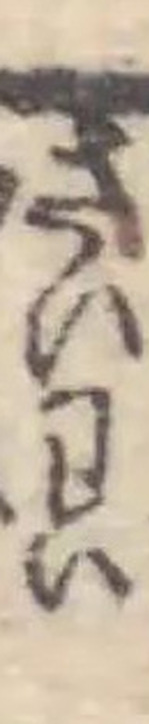さいわい
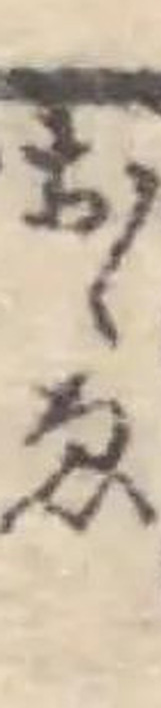おゝゑ
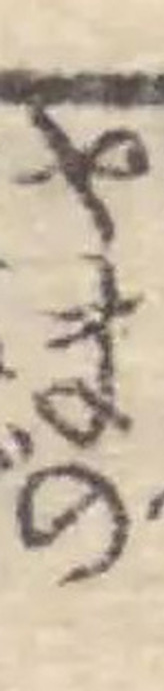やまの
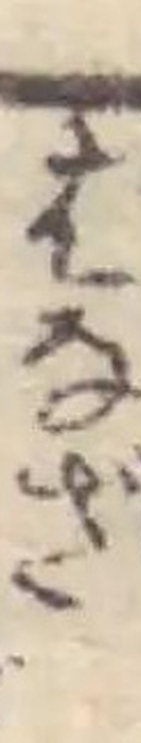はなざ
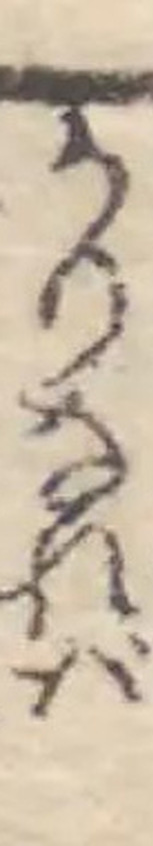かりなれば
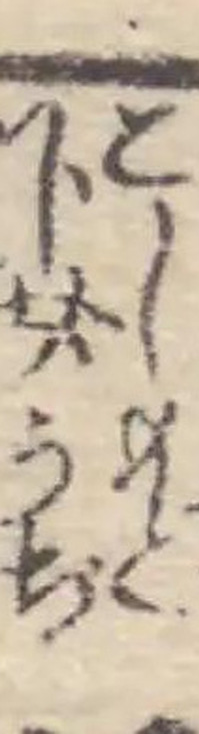下女うち
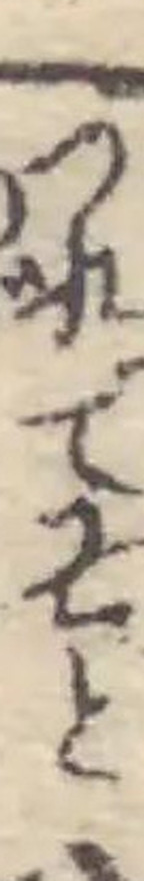つれてそと
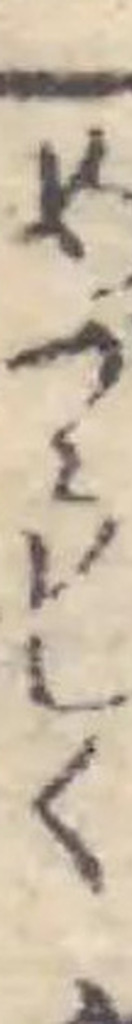めづらしく
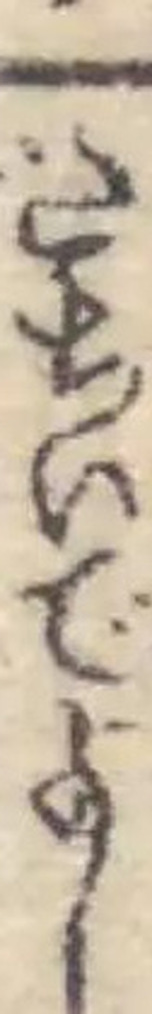たちいでよし
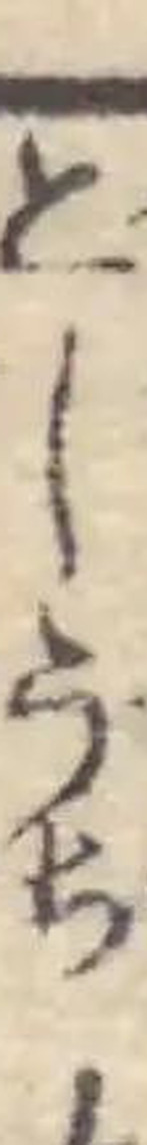こしうち
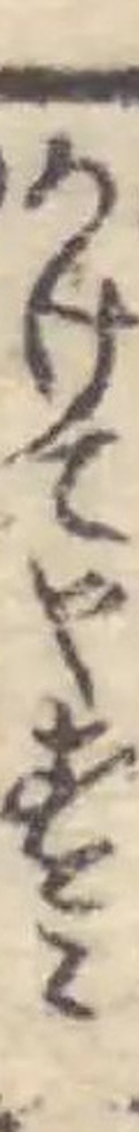かけてやすみ
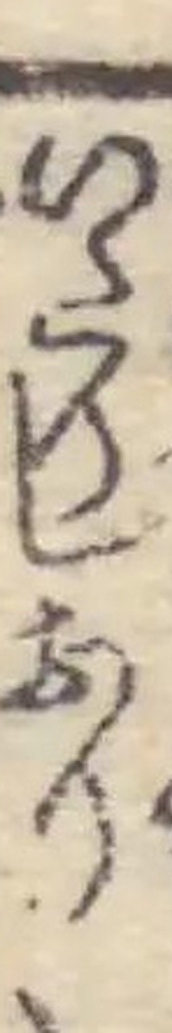いたりしおり
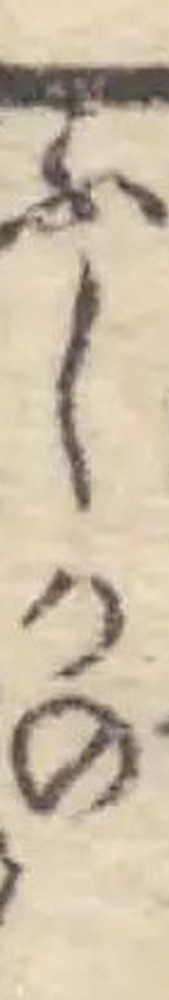ふしかの
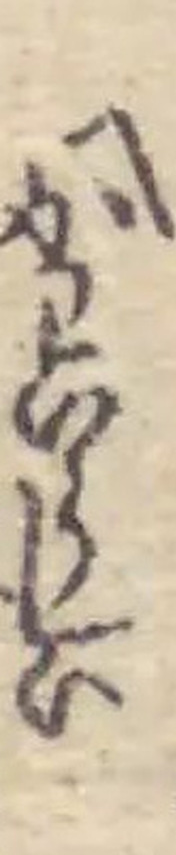〽かわいらしい
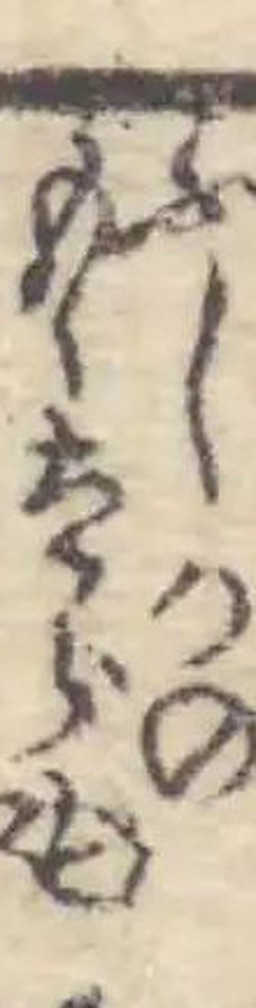もゝ太郎も
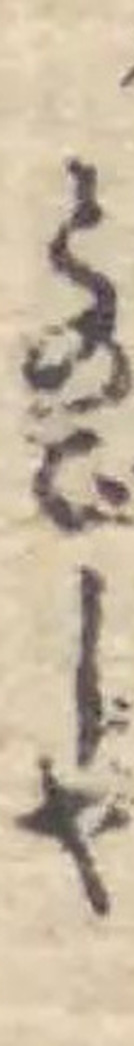とのごじや
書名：化物尽 4巻
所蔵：国立国会図書館 National Diet Library, JAPAN
